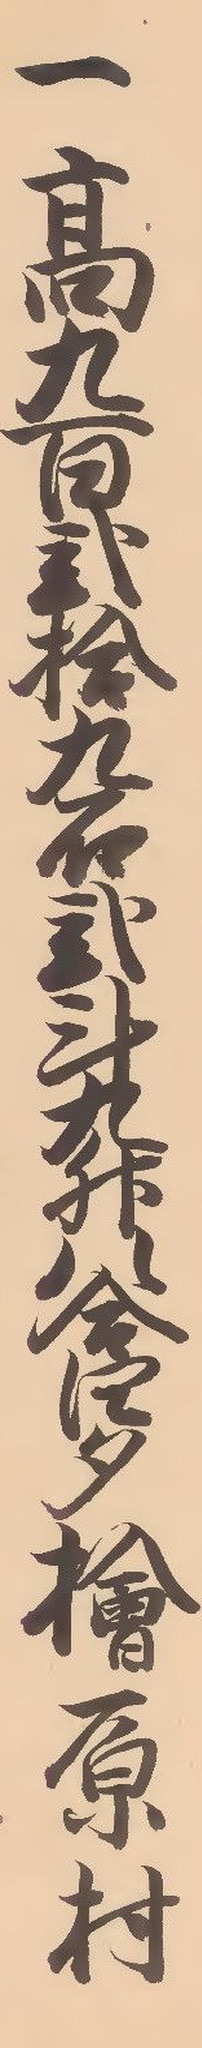一高九百弐拾九石弐斗九升八合四勺桧原村

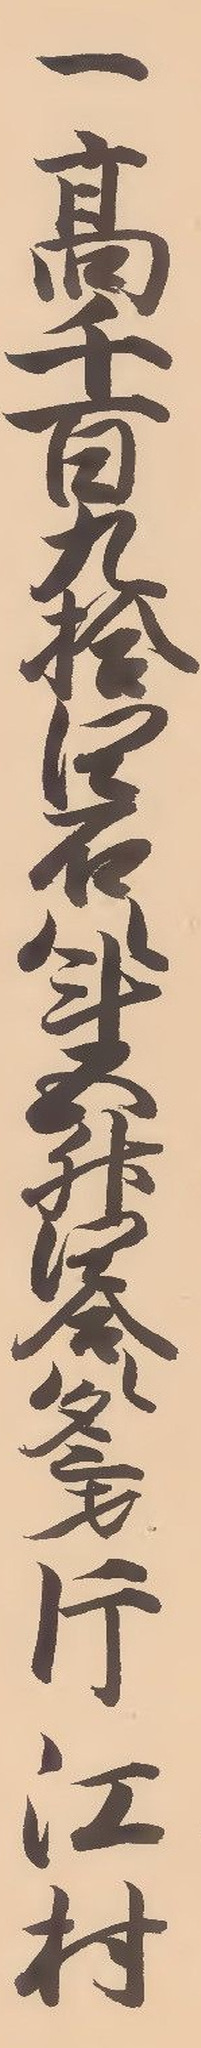一高千百九拾四石八斗五升四合八勺三才片江村
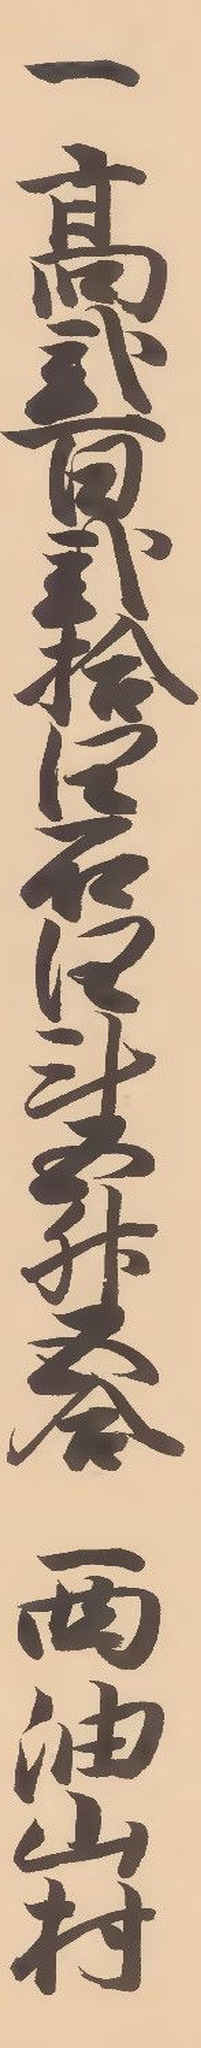一高弐百弐拾四石四斗五升五合西油山村
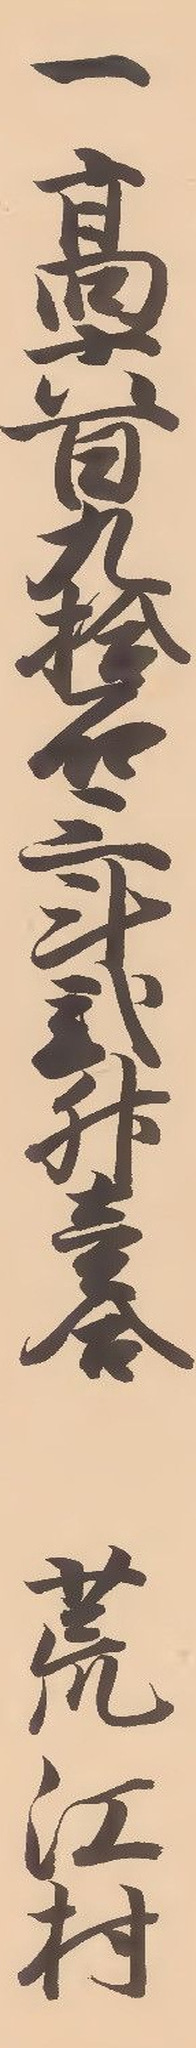一高六百九拾石三斗弐升壱合荒江村
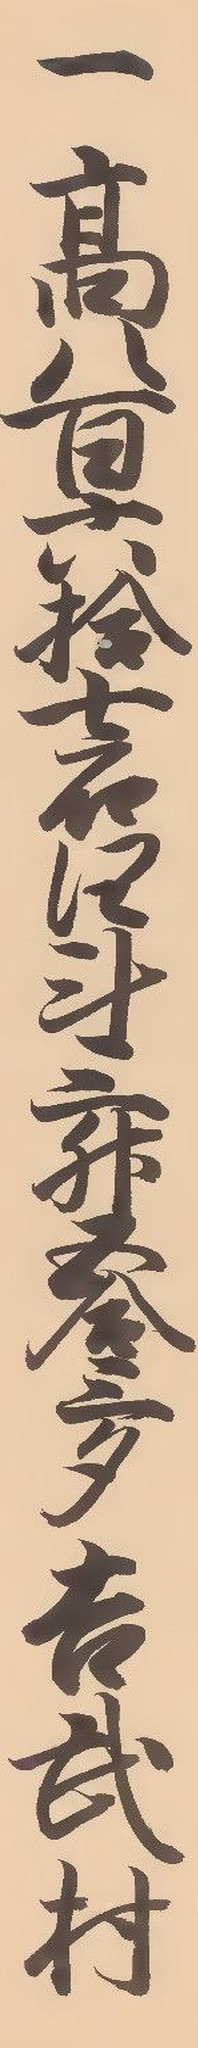一高八百六拾七石四斗三升五合三勺吉武村
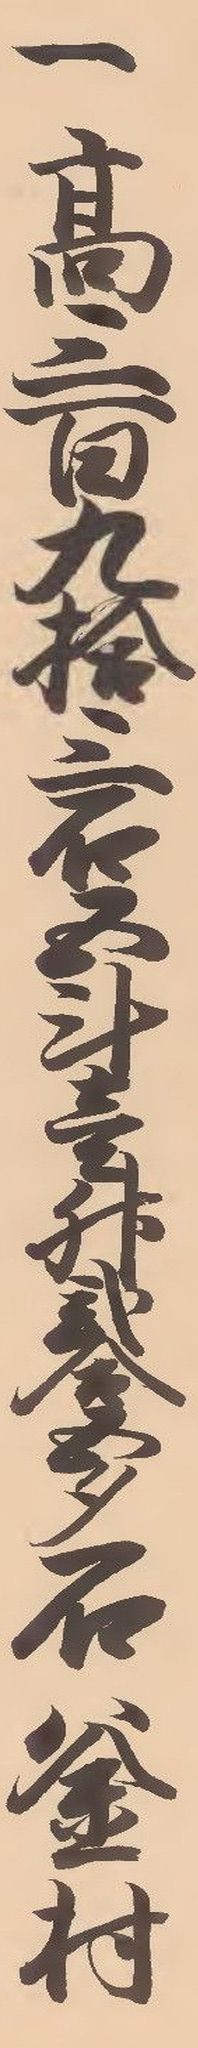一高三百九拾三石五斗壱升弐合五勺石釜村
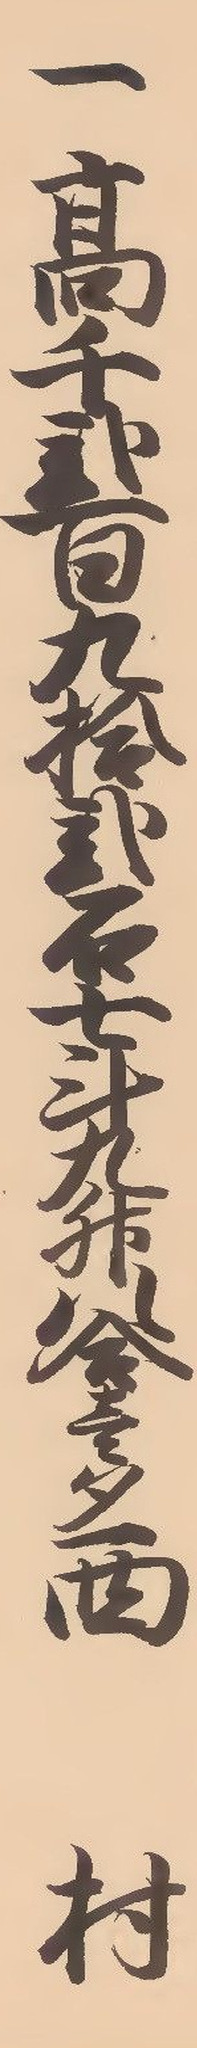一高千弐百九拾弐石七斗九升八合壱勺西村
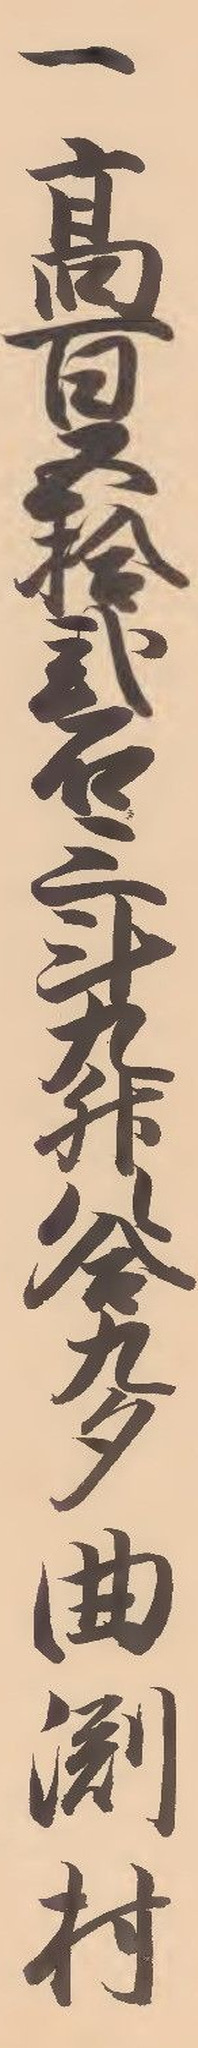一高百五拾弐石三斗九升八合九勺曲渕村
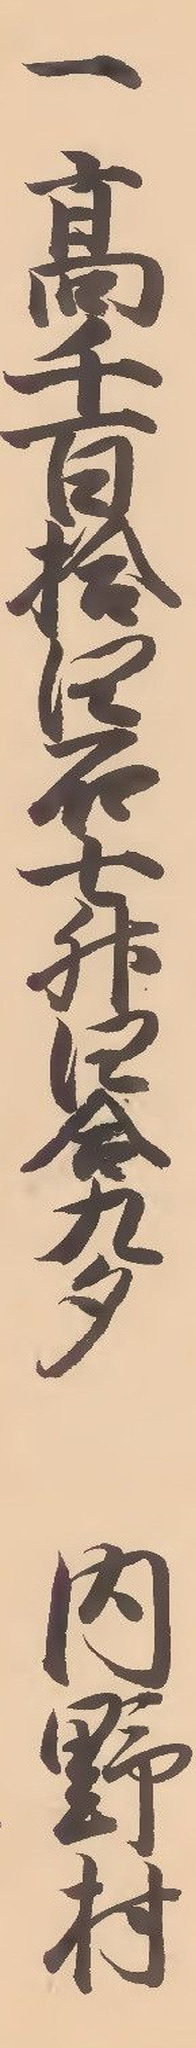一高千百拾四石七升四合九勺内野村

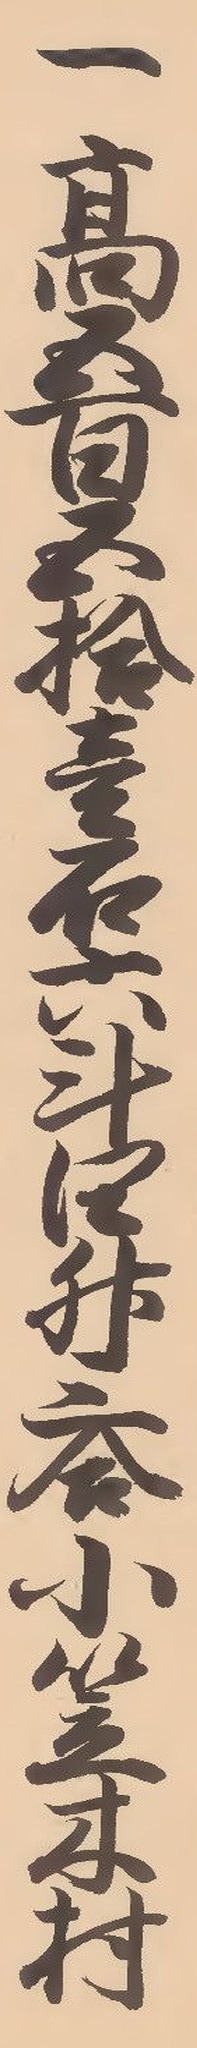一高五百五拾壱石六斗四升三合小笠木村
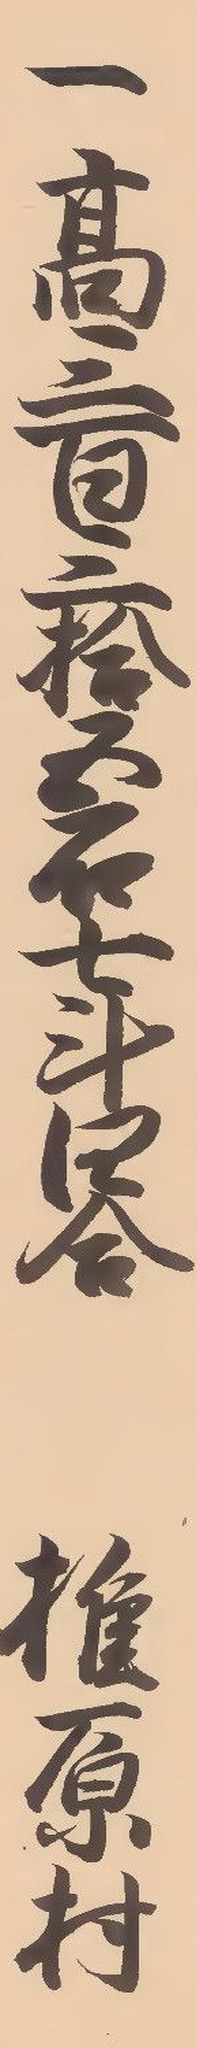一高三百三拾五石七斗四合椎原村
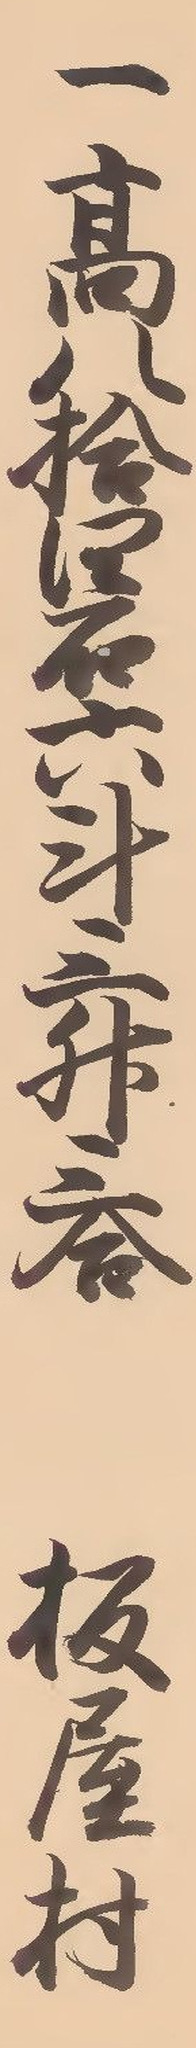一高八拾四石六斗三升三合板屋村
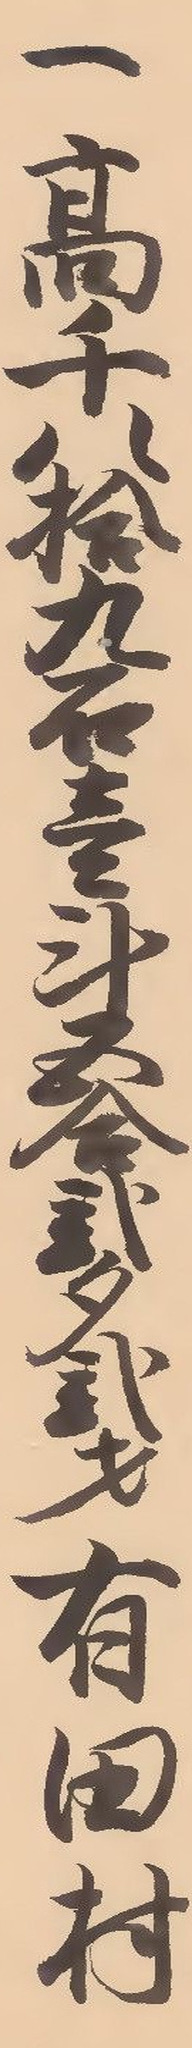一高千八拾九石壱斗五合弐勺弐才有田村
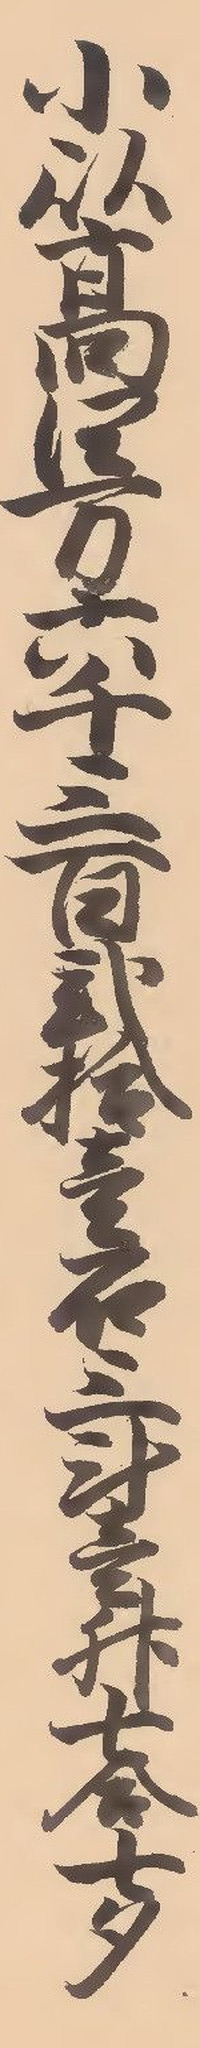小以高四万六千三百弐拾壱石三斗壱升七合七勺

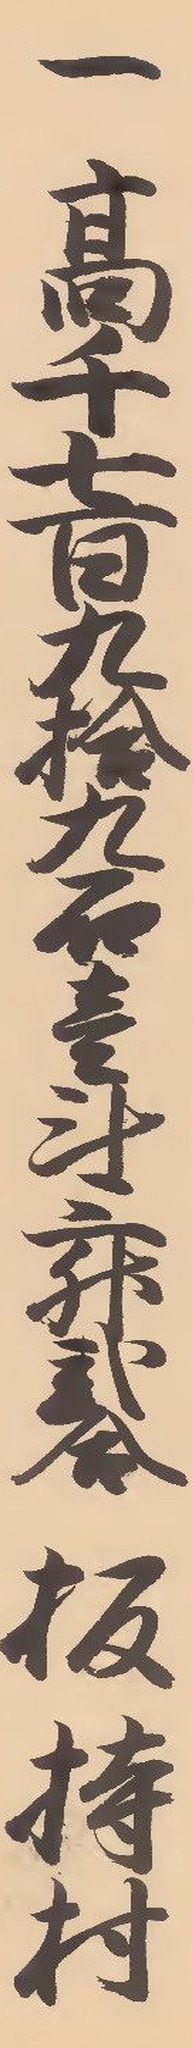一高千七百九拾九石壱斗三升弐合板持村
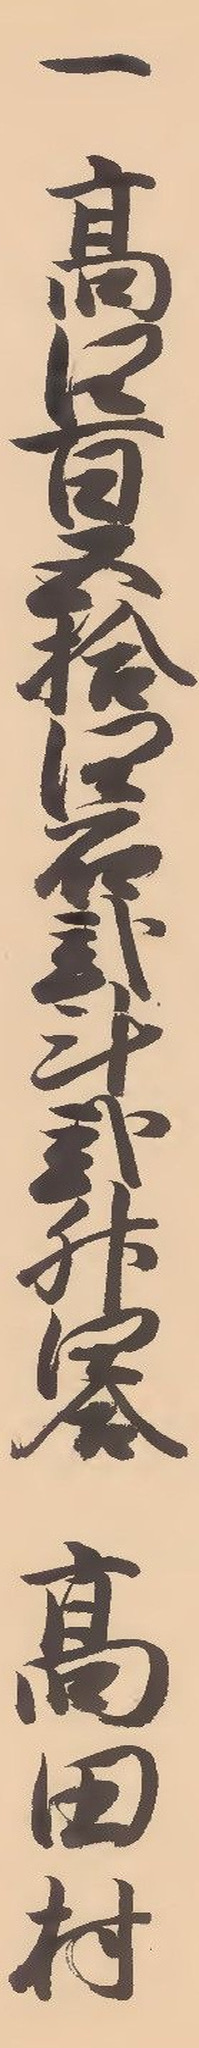一高四百五拾四石弐斗弐升四合高田村
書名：筑前国郷帳
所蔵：国立公文書館 National Archives of Japan
